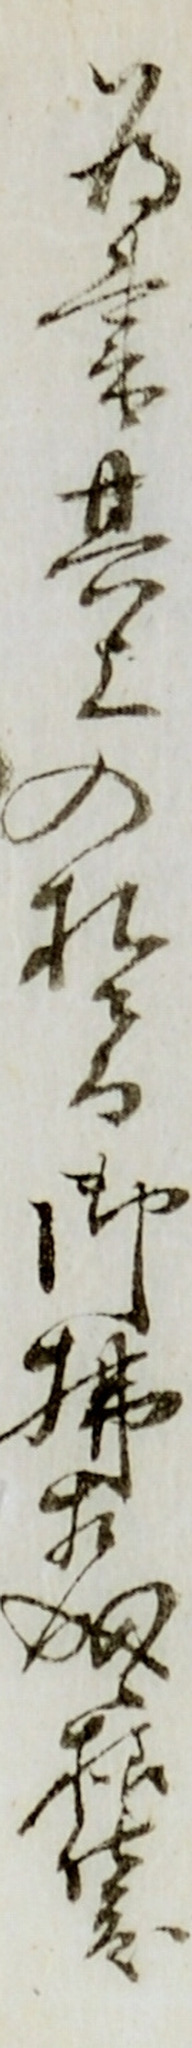為書其上入札にて御払相成候様仕度
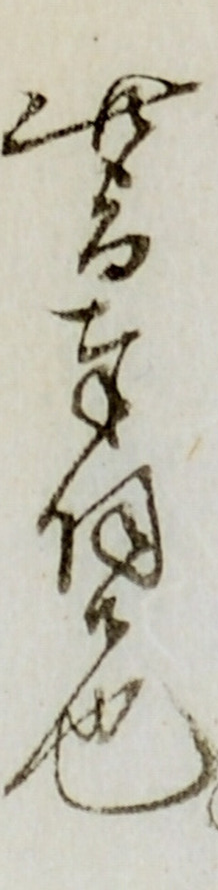此旨奉伺候也
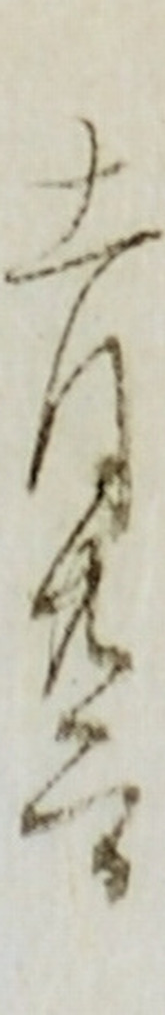十一月廿二日名
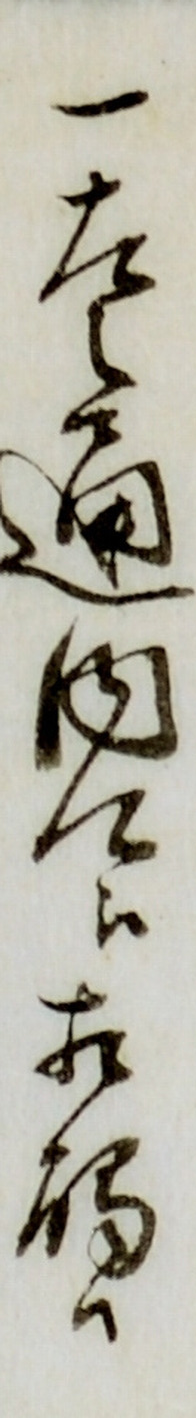一左之通内郷え相触候
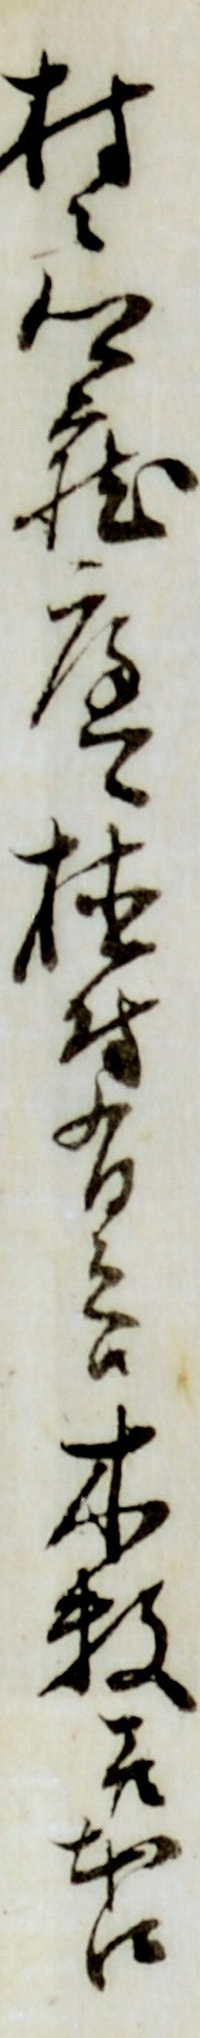村々郷蔵庭へ植付有之候木数幷本口
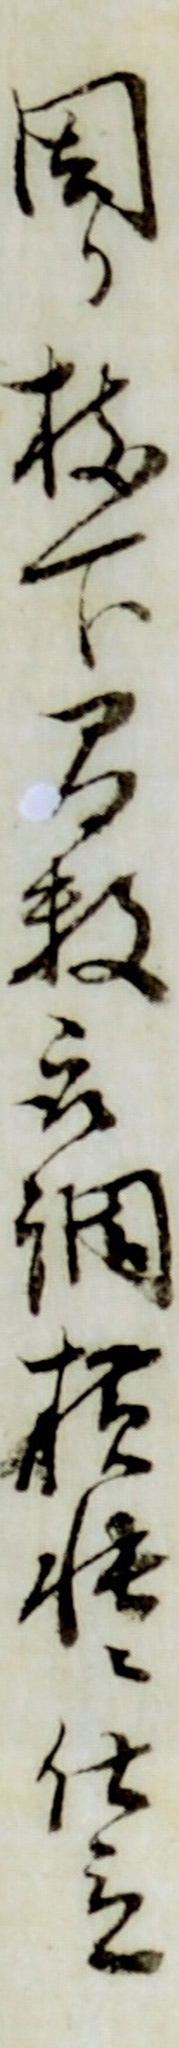周り枝下間数取調横帳に仕立
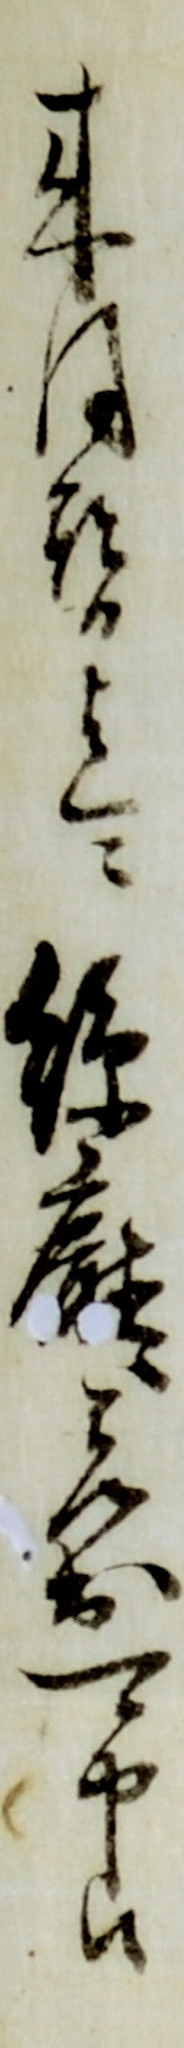来月朔日迄に県庁へ差出可申候
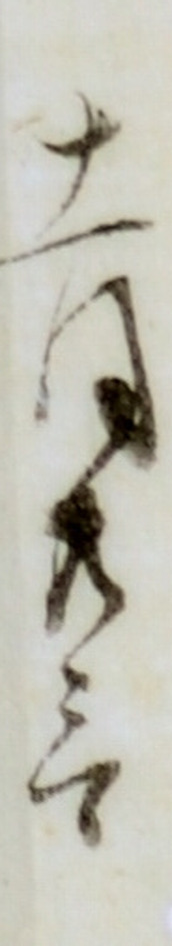十一月廿二日名

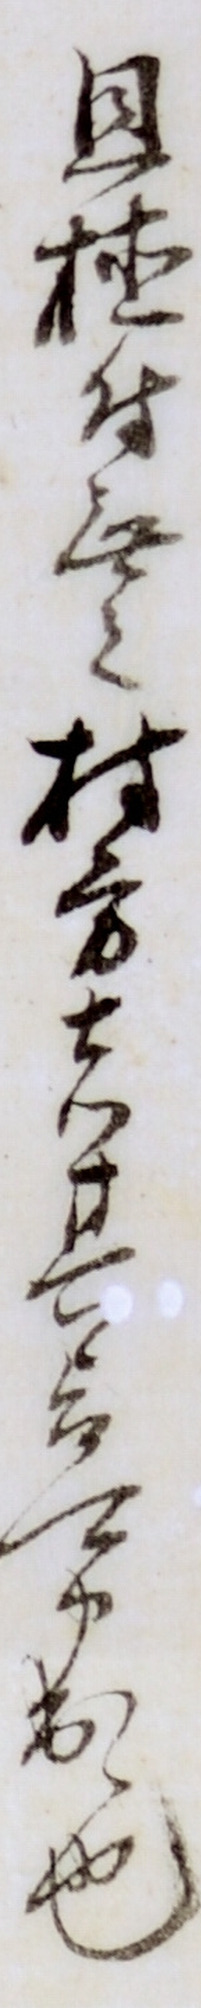且植付無之村方は其旨可申出候也
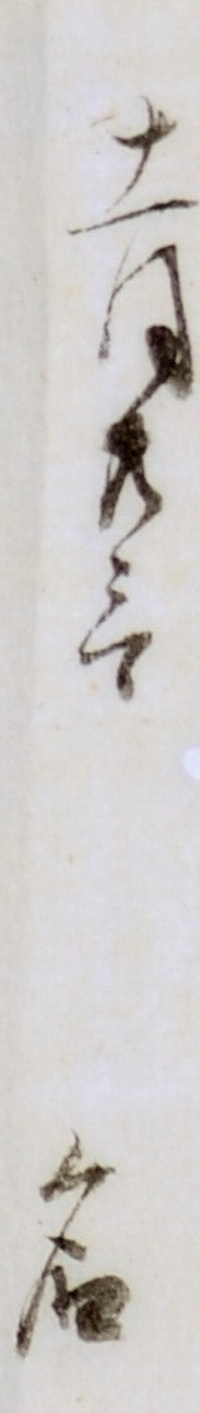十一月廿三日名
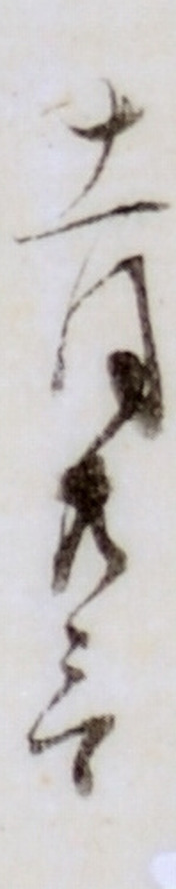十一月廿三日名
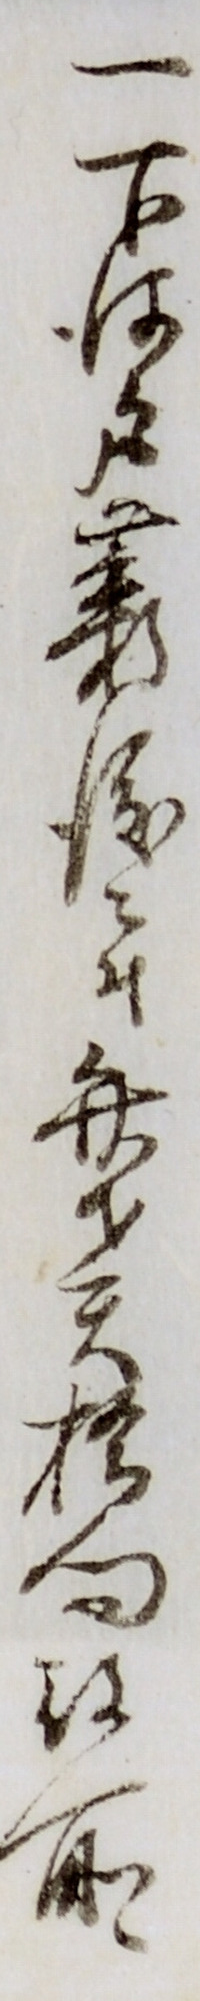一下河原薪渡に付弁財天橋向役所へ
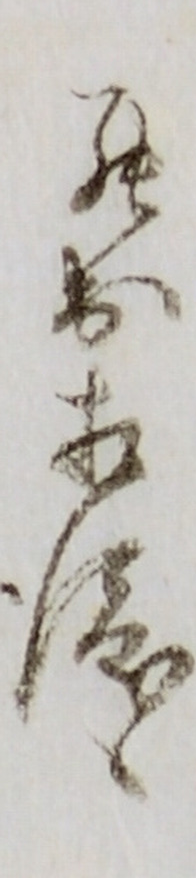罷出相渡候
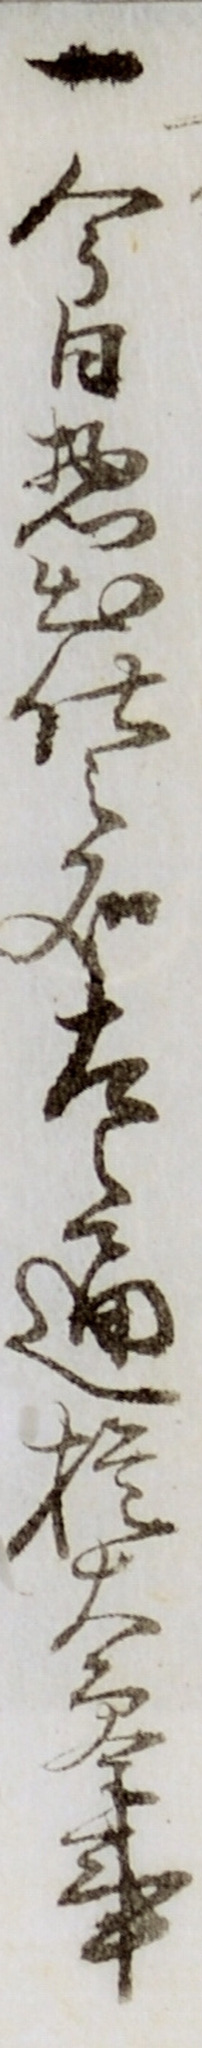一今日惣出仕之処左之通権大参事
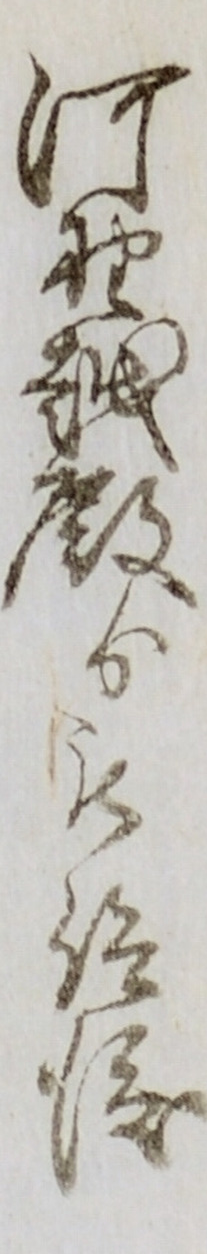河野越殿ゟ被仰渡
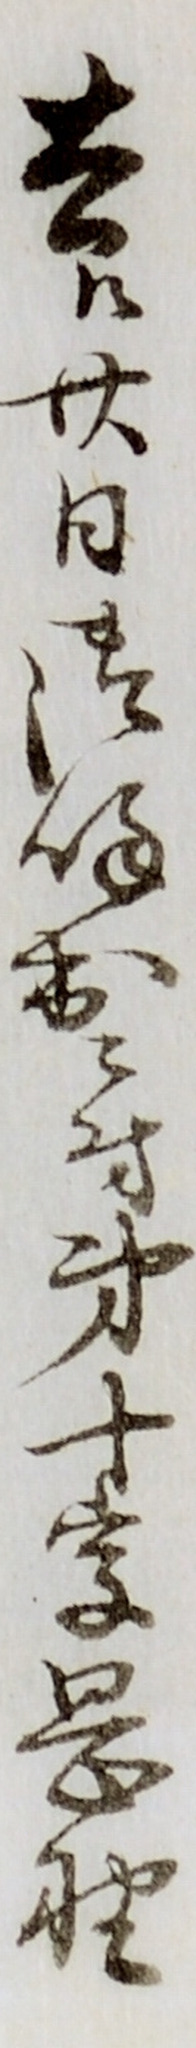去ル廿日御呼出に付第十字岡野
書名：山林方諸事御用留
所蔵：伊那市立高遠町図書館・合同会社AMANE
